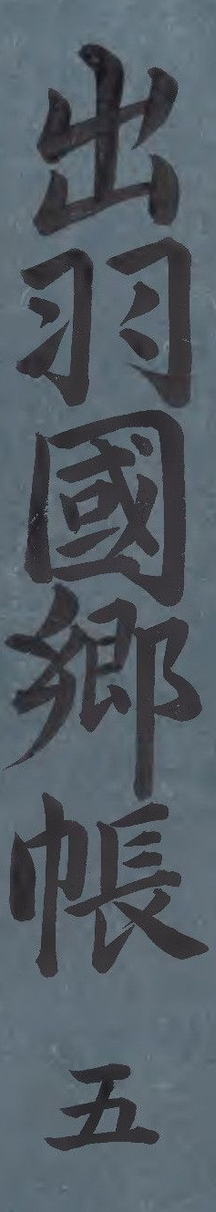出羽国郷帳五

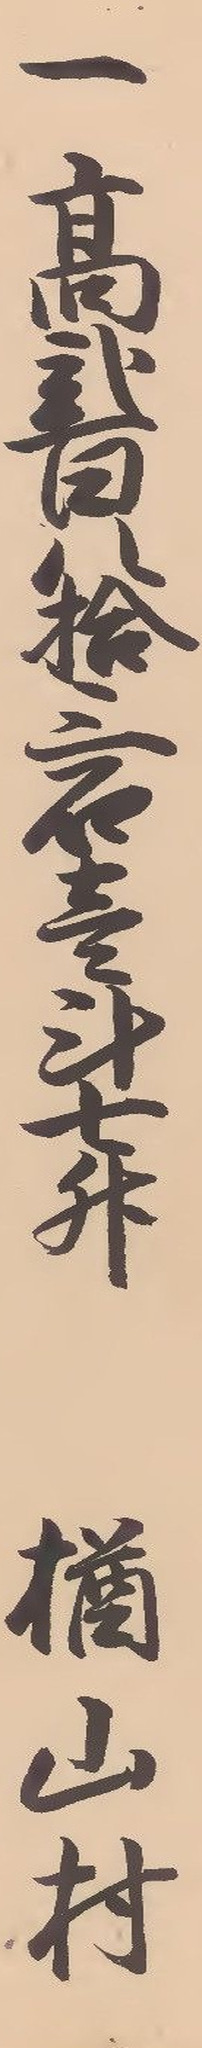一高弐百八拾三石壱斗七升猶山村
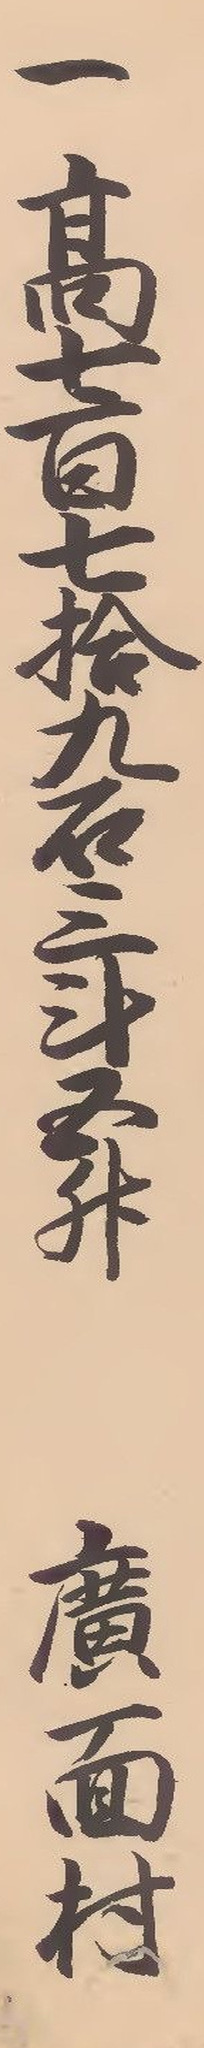一高七百七拾九石三斗五升広面村

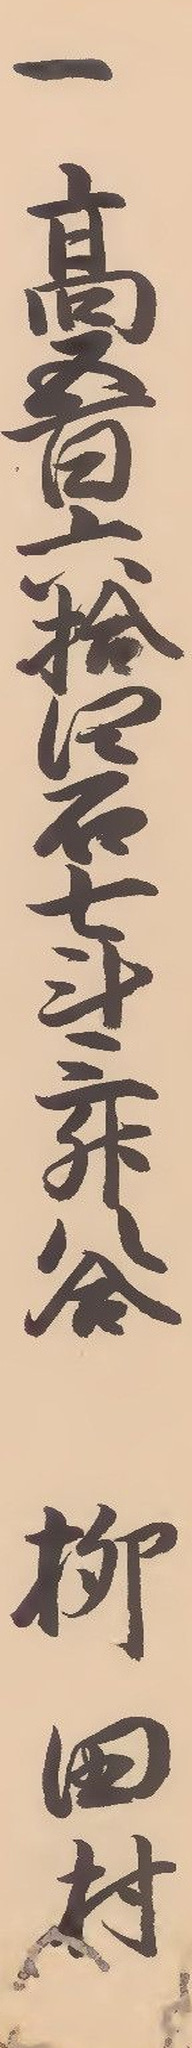一高五百六拾四石七斗三升八合柳田村
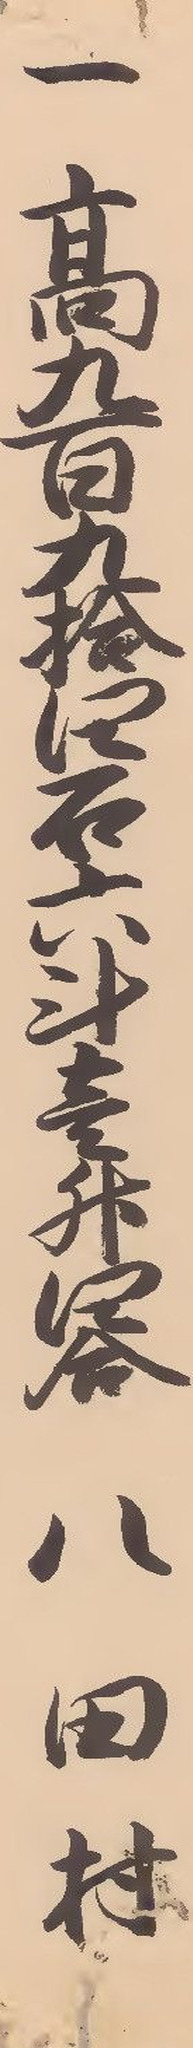一高九百九拾四石六斗壱升四合八田村
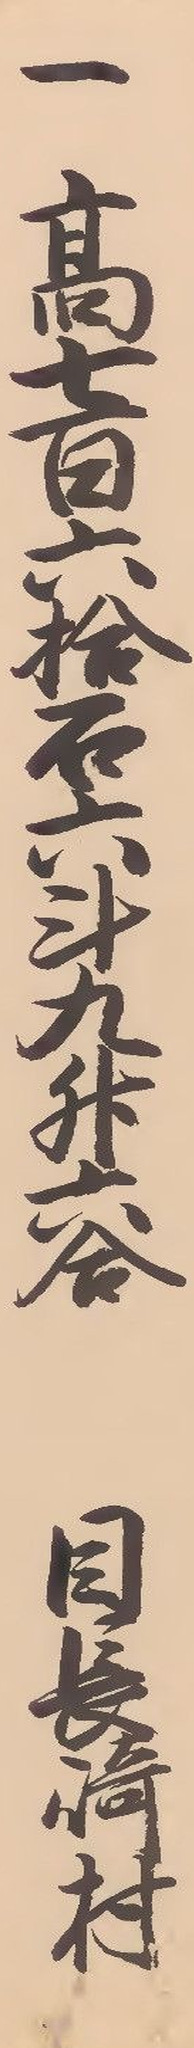一高七百六拾石六斗九升六合目長崎村
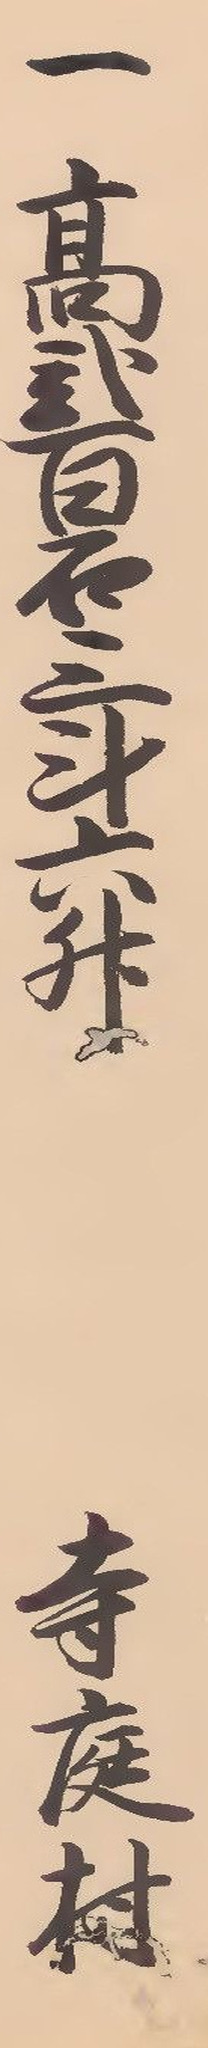一高弐百石三斗六升寺庭村
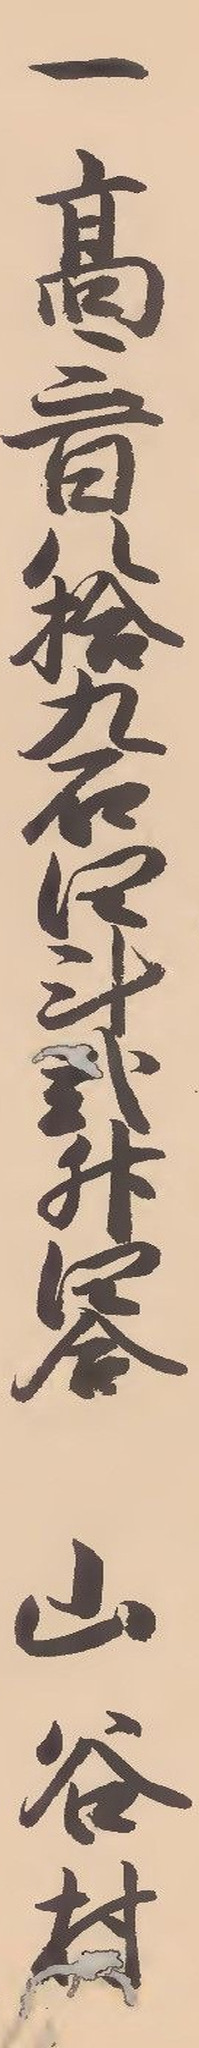一高三百八拾九石四斗弐升四合山谷村
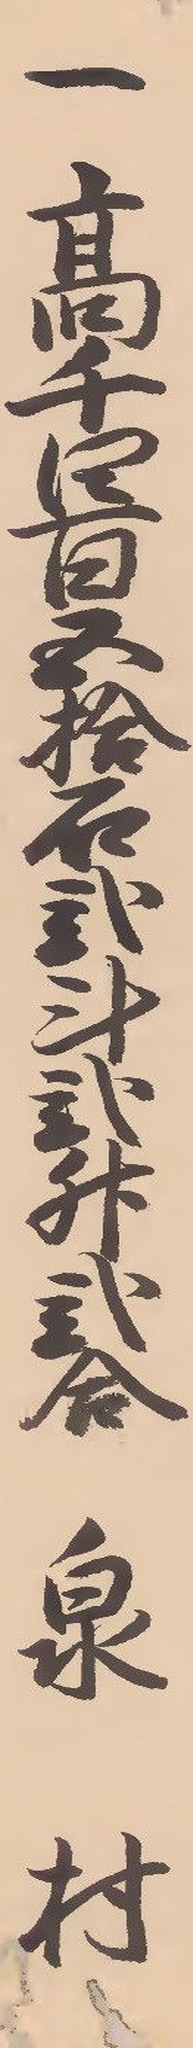一高千四百五拾石弐斗弐升弐合泉村
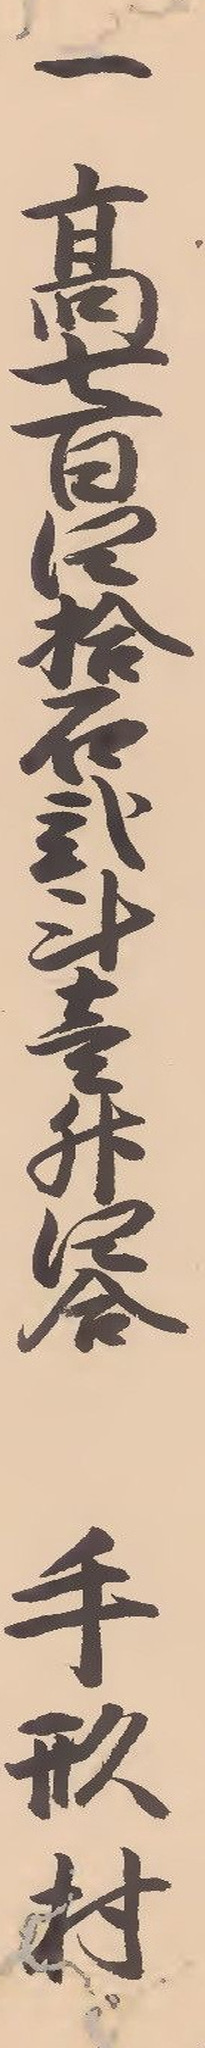一高七百四拾石弐斗壱升四合手形村
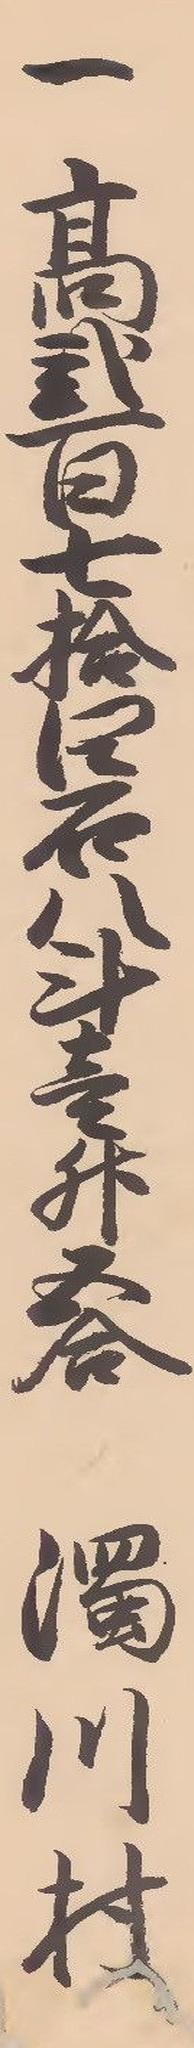一高弐百七拾四石八斗壱升五合濁川村

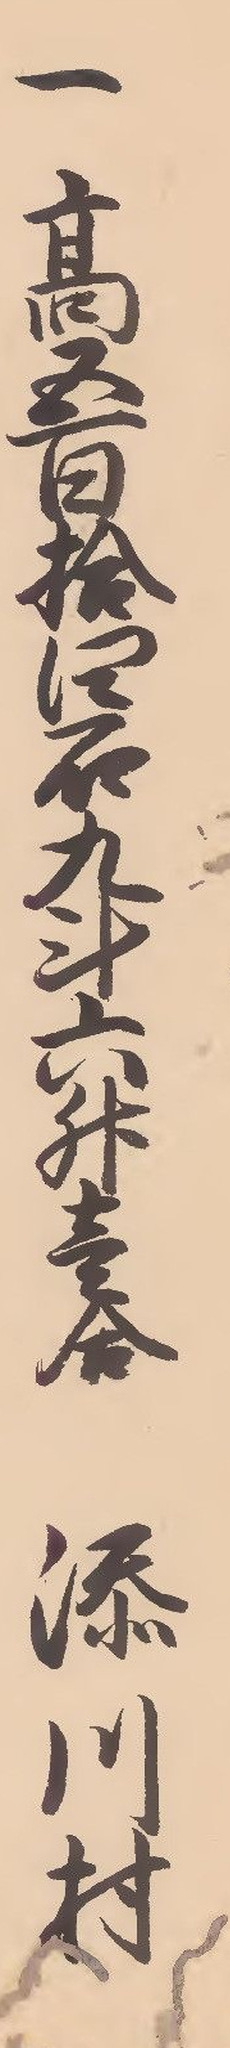一高百五拾四石九斗六升壱合添川村
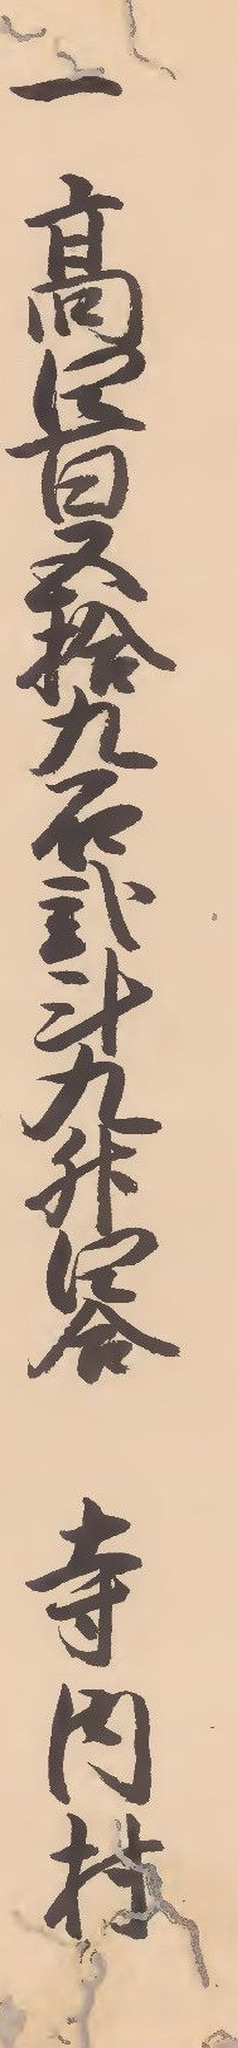一高四百五拾九石弐斗九升四合寺内村
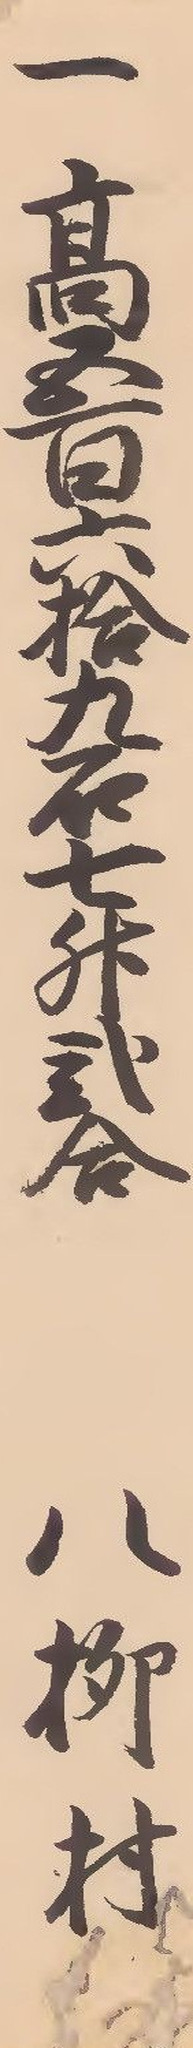一高五百六拾九石七升弐合八柳村
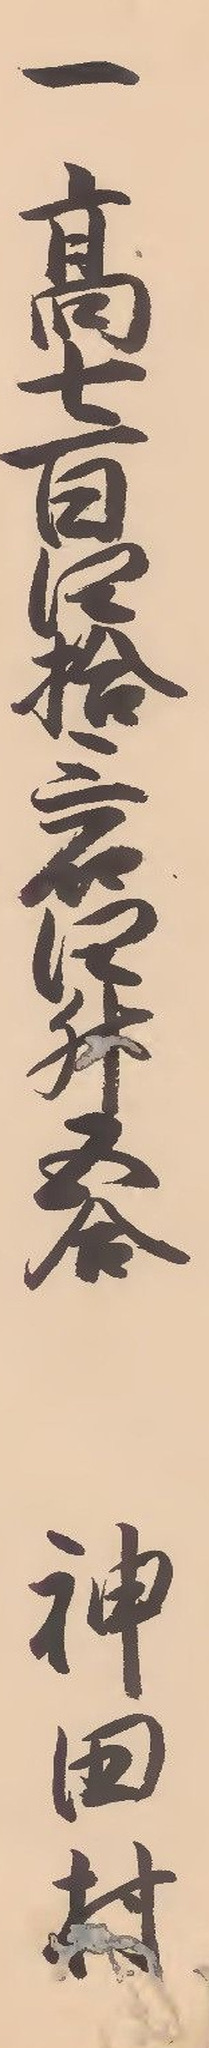一高七百四拾三石四升五合神田村
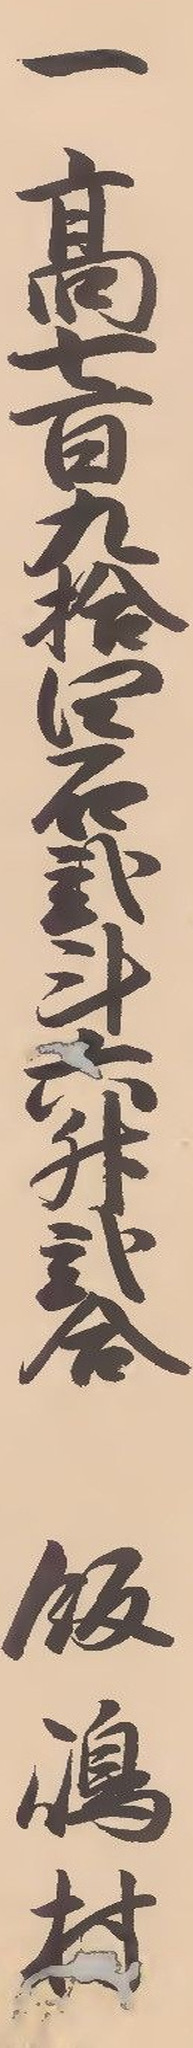一高七百九拾四石弐斗六升弐合飯島村
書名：出羽国郷帳　５
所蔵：国立公文書館 National Archives of Japan
